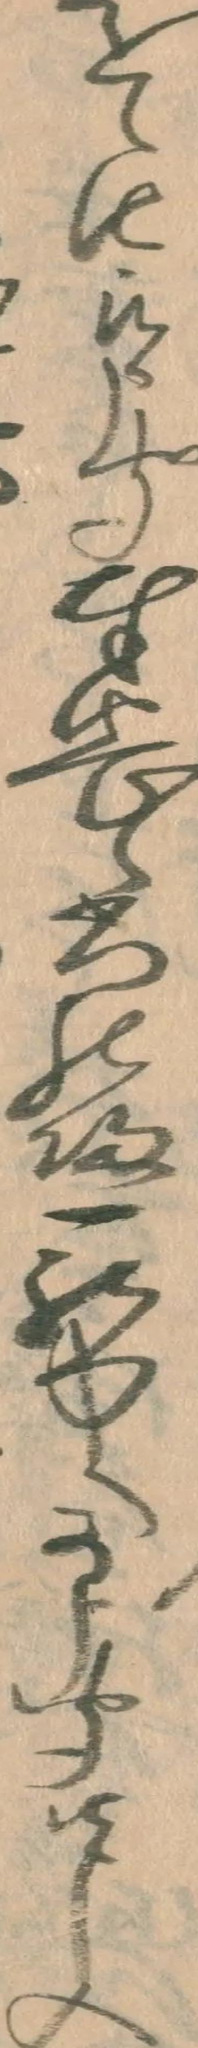進候由被申聞奉畏候尚罷帰一社中へ可申聞由申入
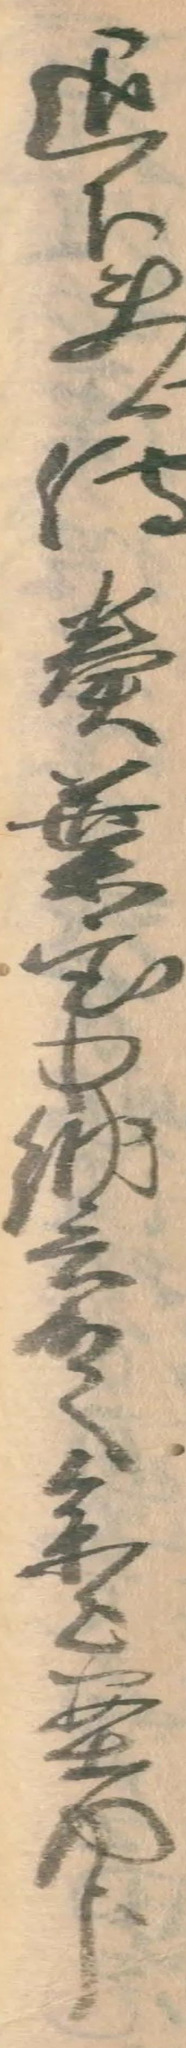退下夫ゟ伝奏葉室中納言殿へ参上案内申
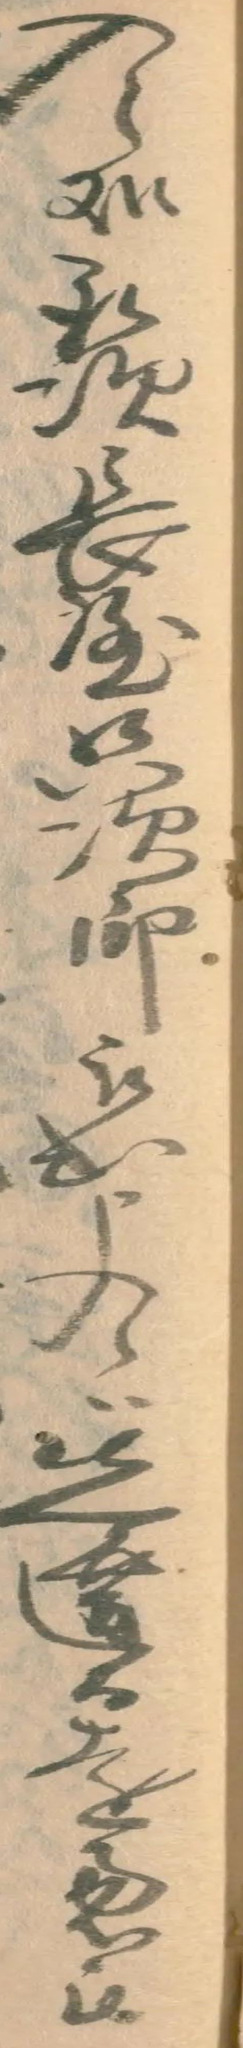入候処取次長屋只次郎被出申入候ハ先達而遠慮被
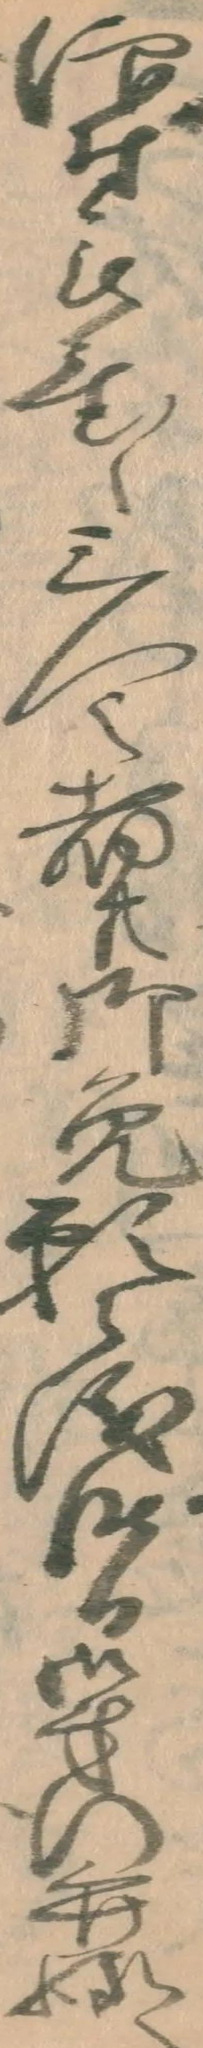仰付被置候三人之者共御免願之儀昨日御奉行并様へ
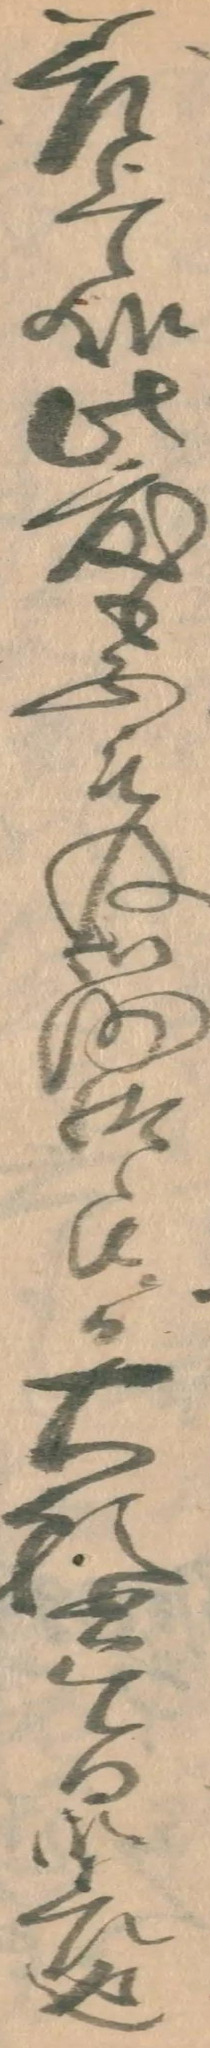差上候処此度も不被及御沙汰之由ニ而右願書今日御差返
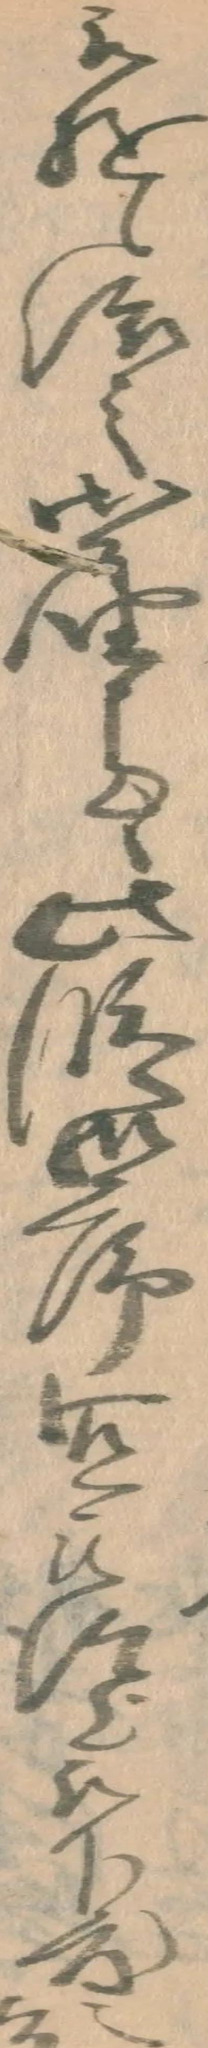被遊候依之御届申上候此段御序宜被仰上被下度之旨
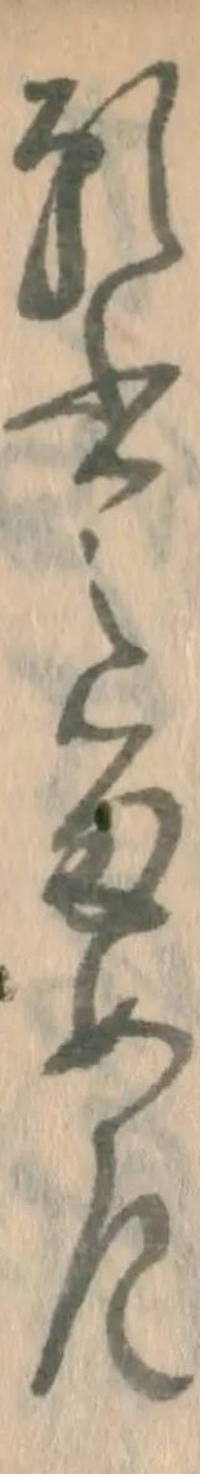願書之留如左
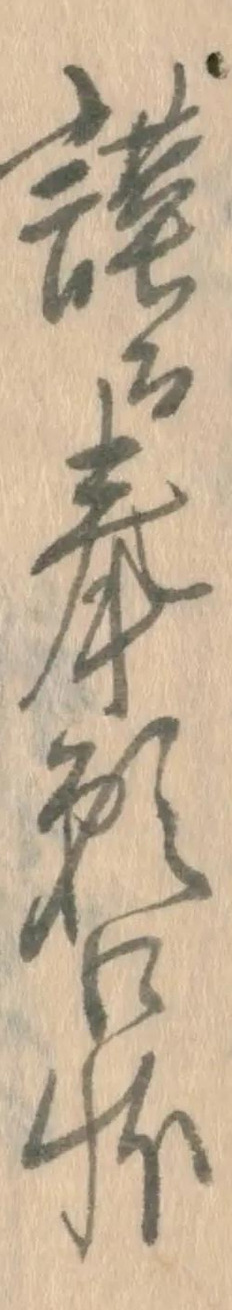謹而奉願口状
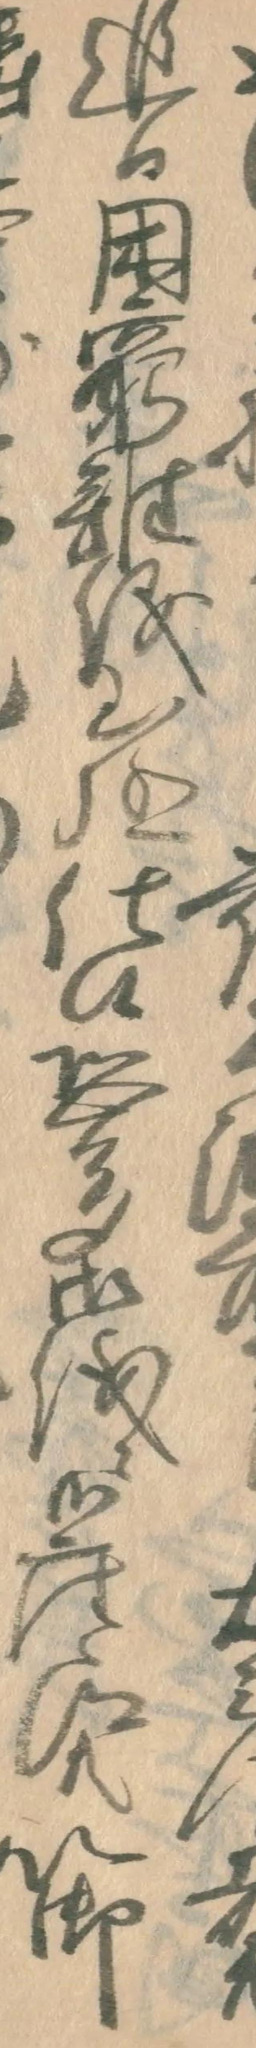追日困窮難儀至極仕候恐多御儀ニ御座候得共以御
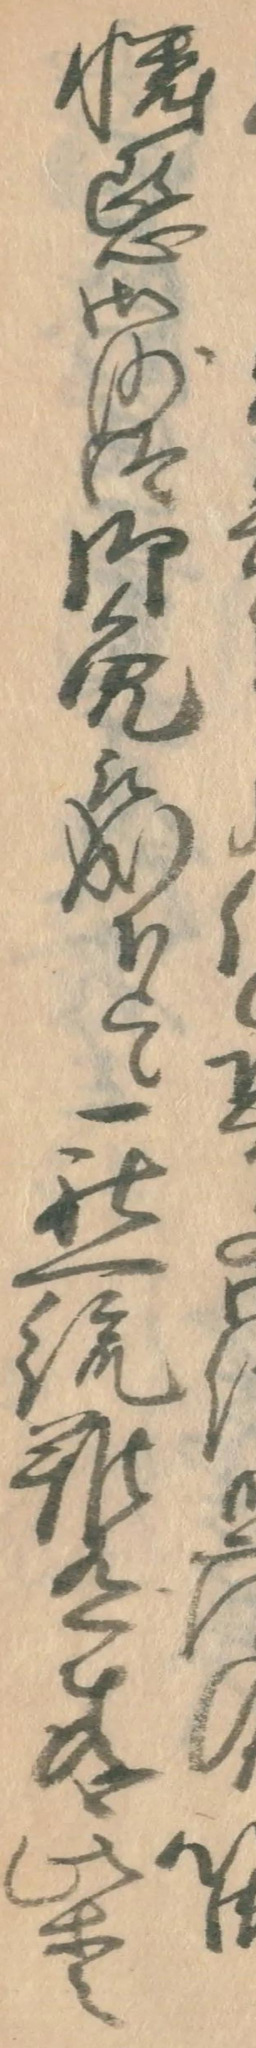憐愍御沙汰御免被成下候ハヽは一社一統難有奉存候此等之

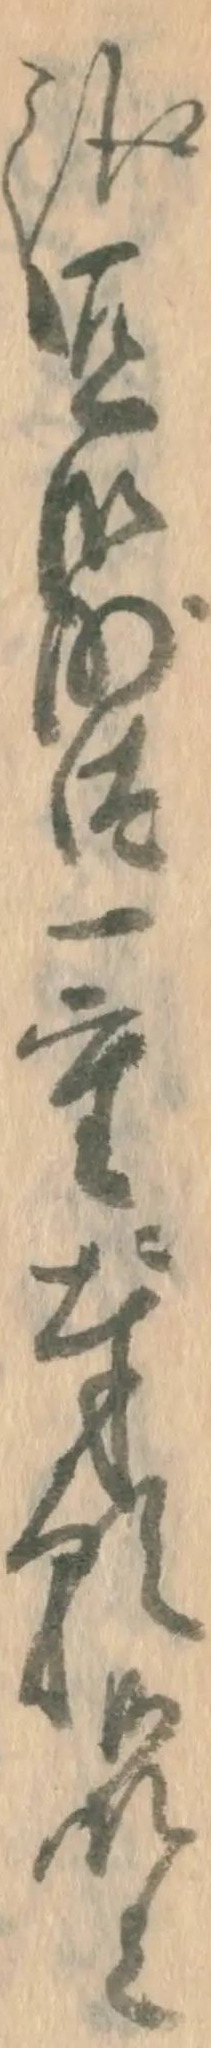趣宜御沙汰一重ニ奉願候以上
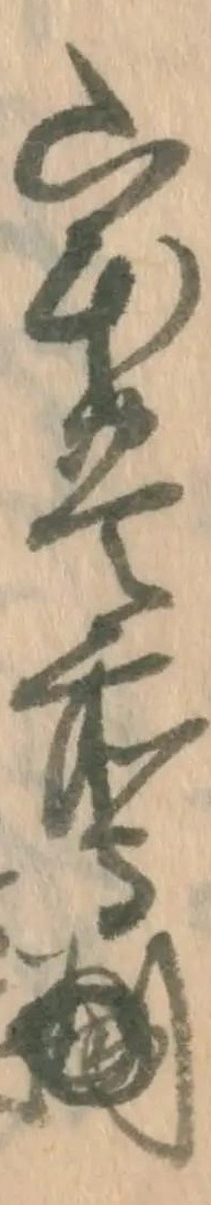山本豊前守判
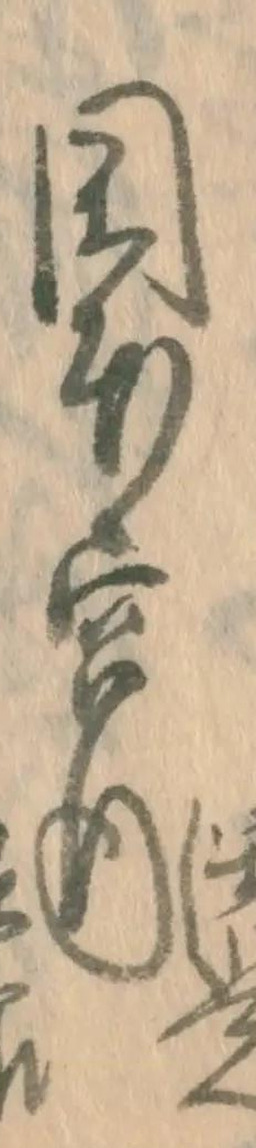岡本宮内
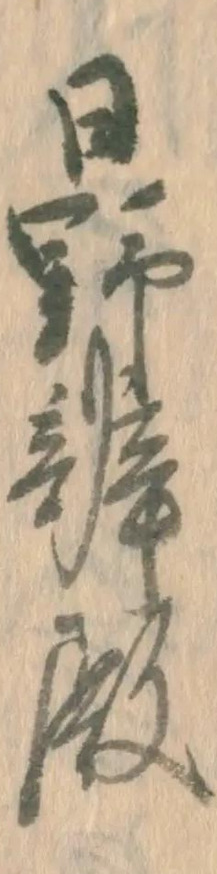日野弁殿
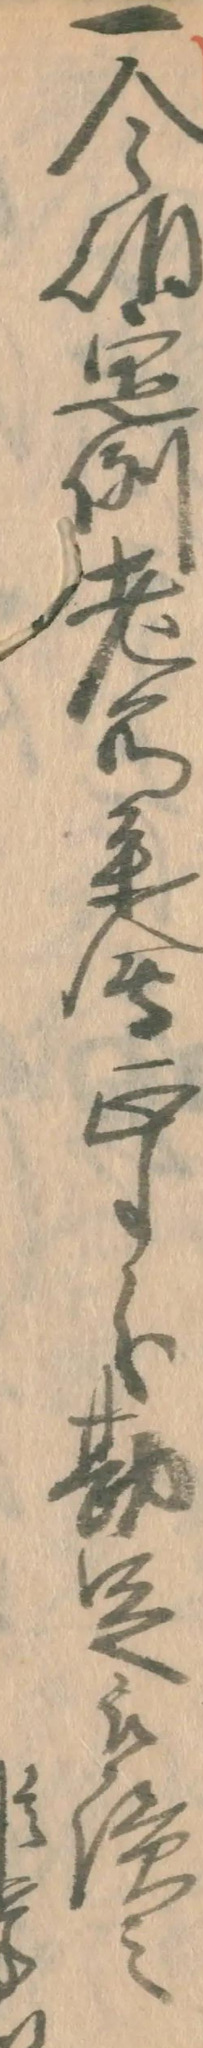一今朝定例老若参会正月分勘定被読之
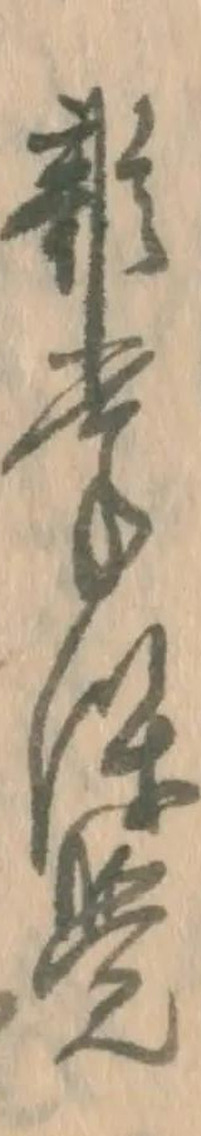雑掌保覚
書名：賀茂社記録. 第60冊
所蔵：国立国会図書館 National Diet Library, JAPAN
